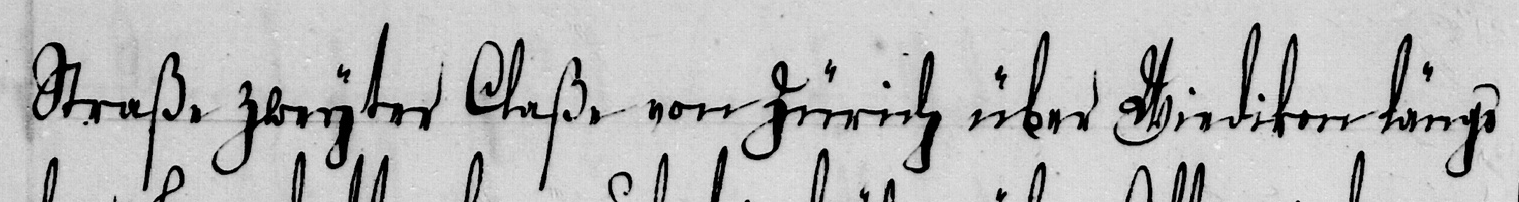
Straße zweyter Claße von Zürich über Wiedikon längs
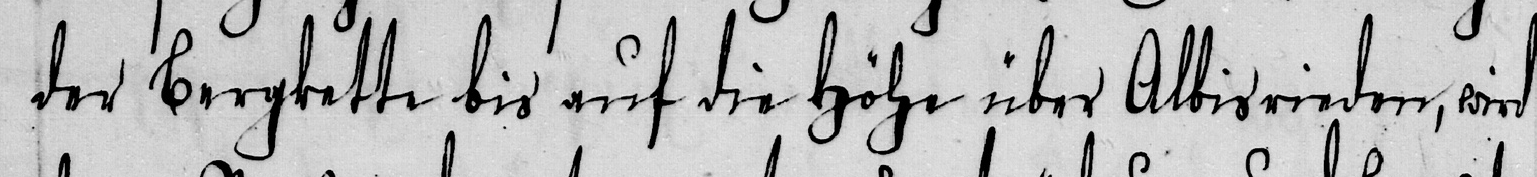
der Bergkette bis auf die Höhe über Albisrieden, wird
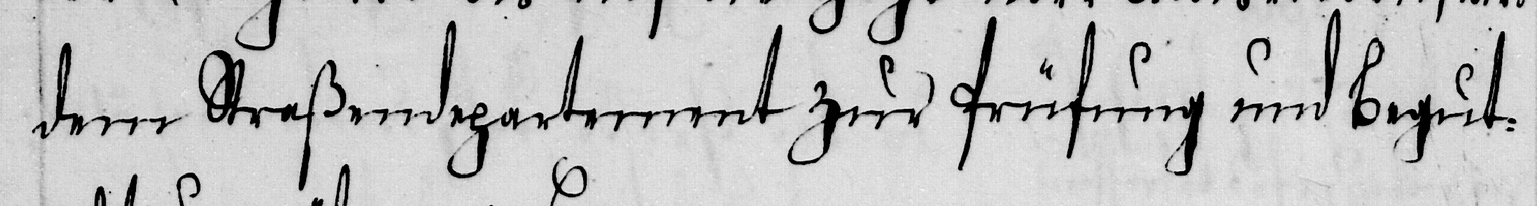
dem Straßendepartement zur Prüfung und Begut¬
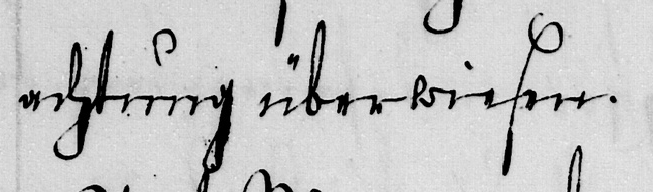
achtung überwiesen.
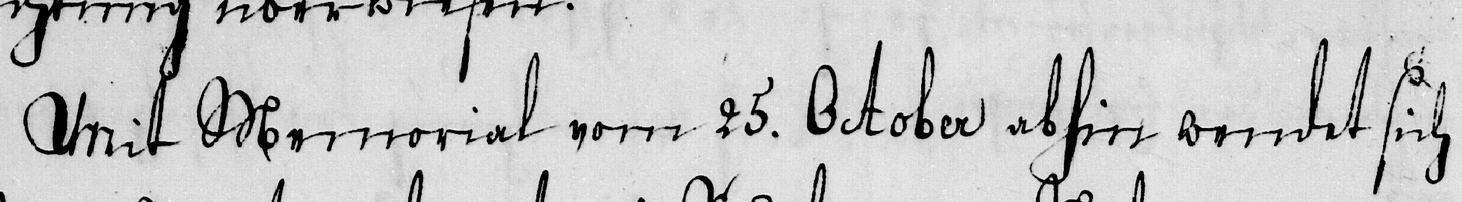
Mit Memorial vom 25. October abhin wendet sich
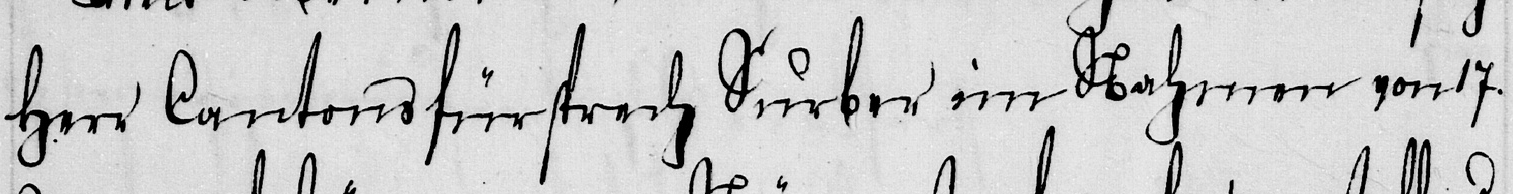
Herr Cantonsfürsprech Surber im Nahmen von 17.
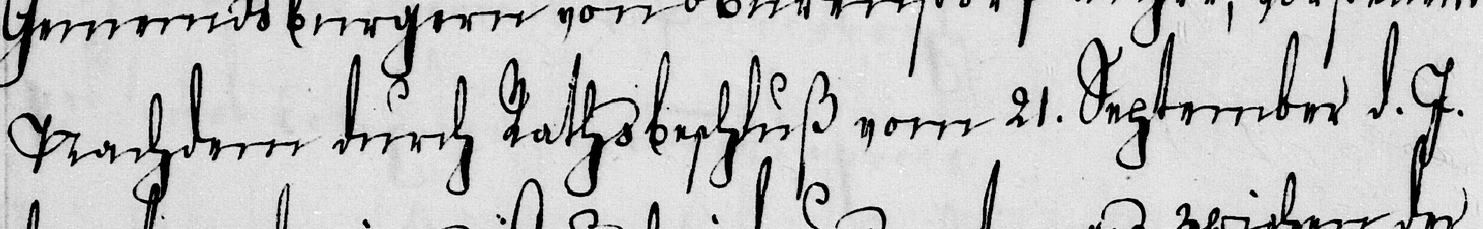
Nachdem durch Rathsbeschluß vom 21. September d. J.
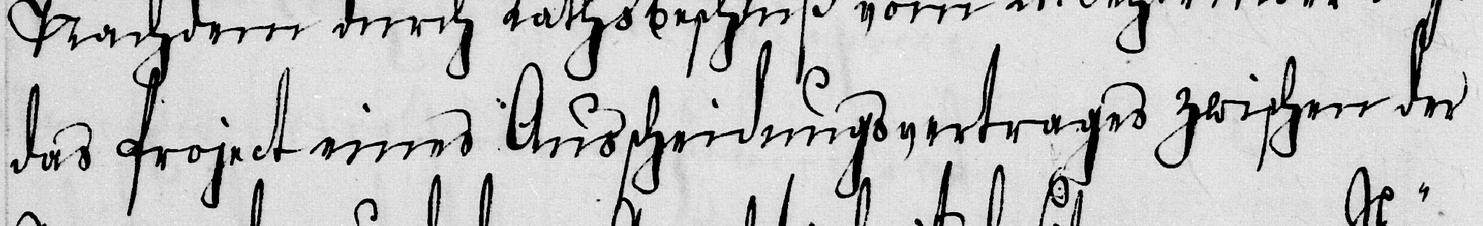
das Project eines Ausscheidungsvertrages zwischen der
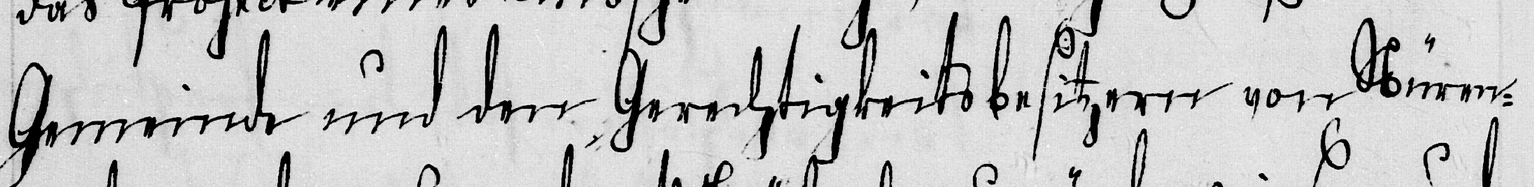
Gemeinde und den Gerechtigkeitsbesitzern von Nüren¬
